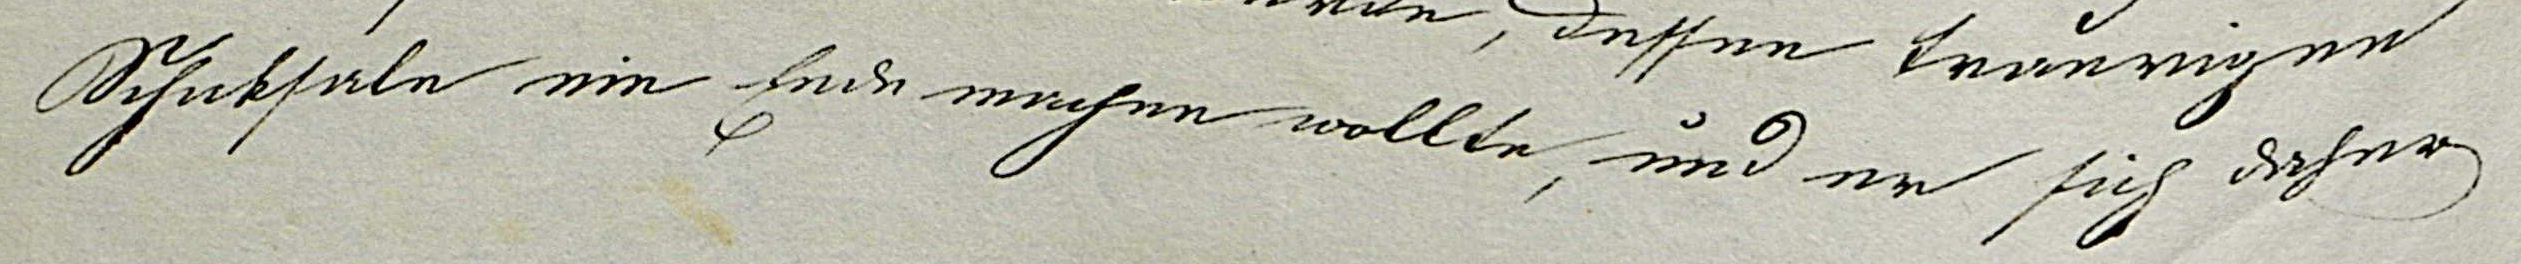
Schicksale ein Ende machen wollte, und er sich daher
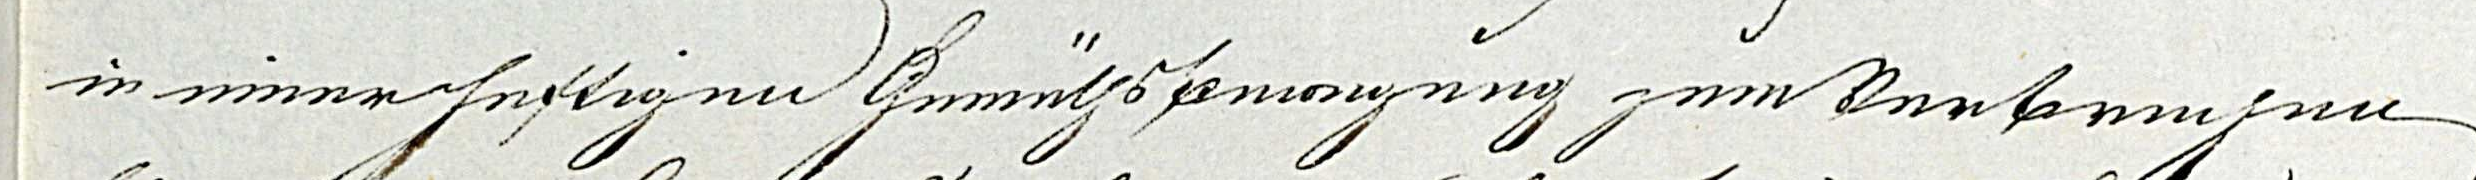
in einer heftigen Gemüthsbewegung zum Verbrechen
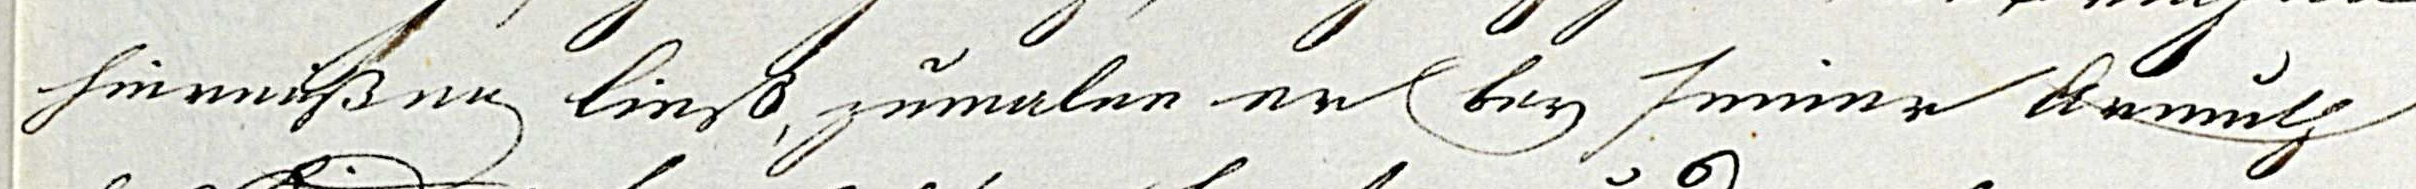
hinreißen ließ, zumalen er bey seiner Armuth
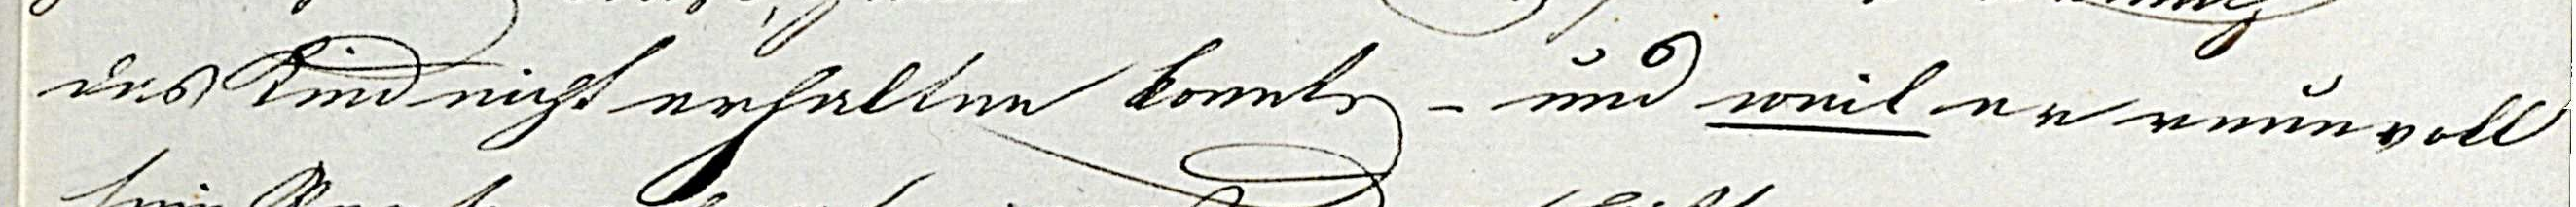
das Kind nicht erhalten konnte – und weil er reuevoll
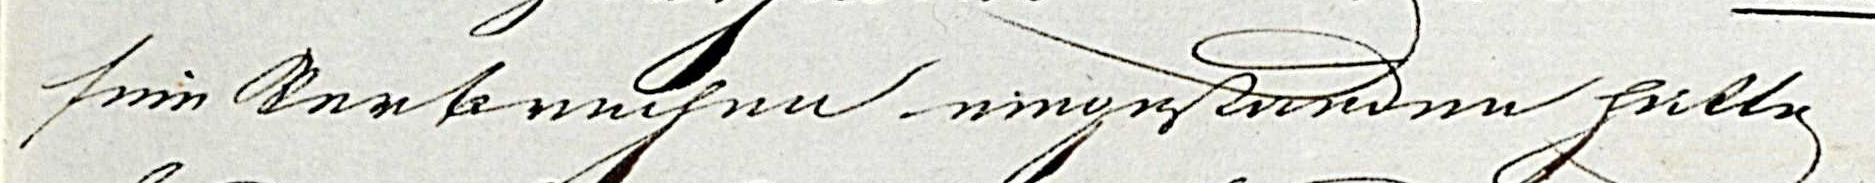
sein Verbrechen eingestanden hatte.
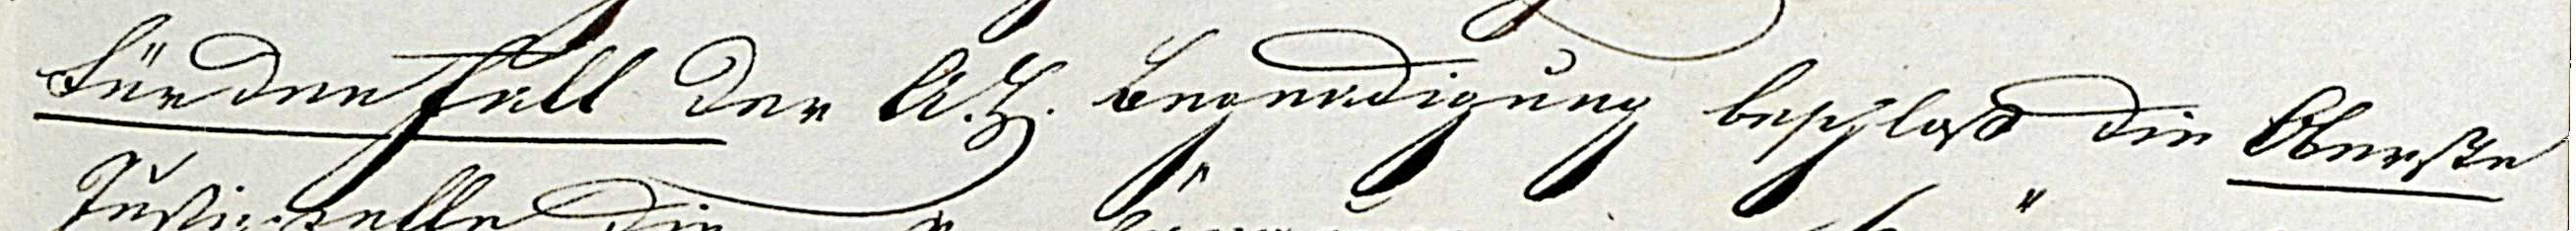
Für den Fall der A.h. Begnadigung beschloß die Oberste
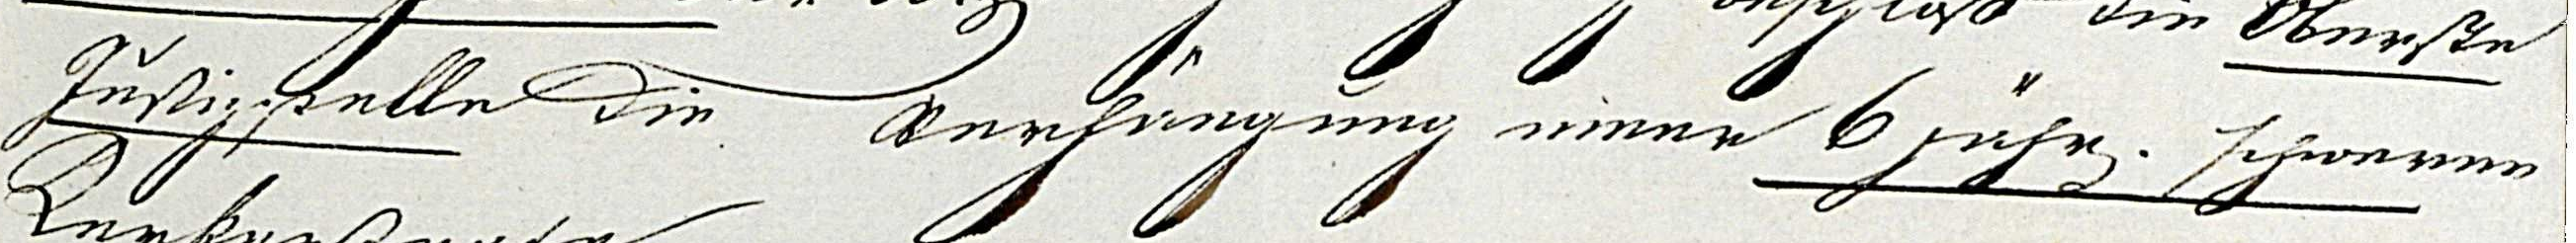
Justizstelle die Verhängung einer 6jähr. Schweren
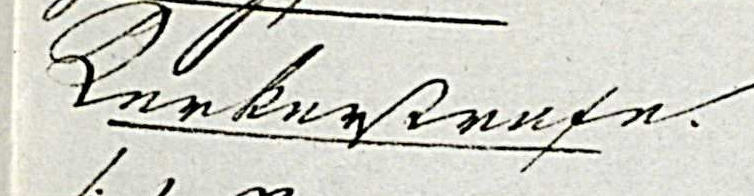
Kerkerstrafe.
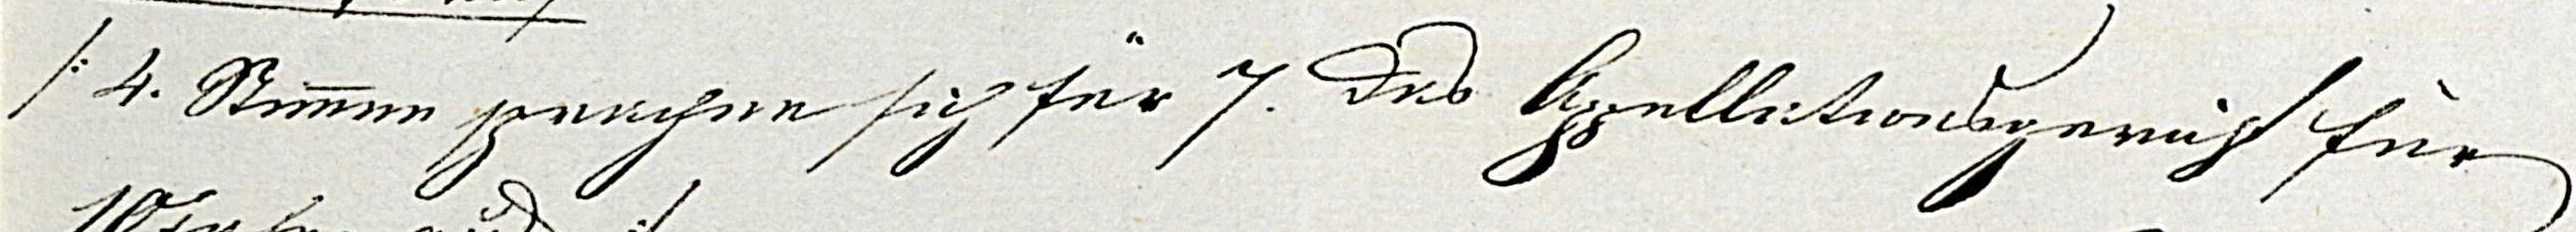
(4 Stimmen sprachen sich für 7 des Appellationsgericht für
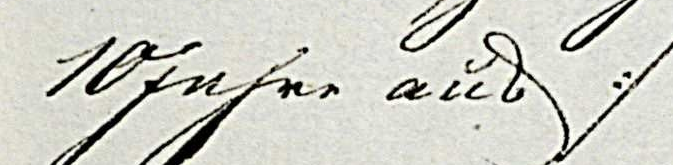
10 Jahre aus)
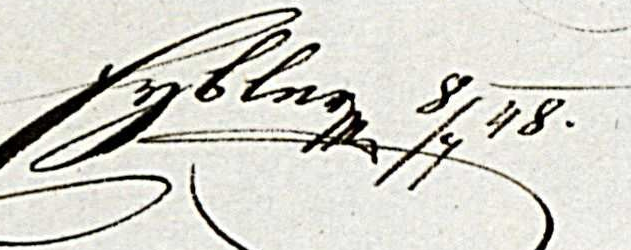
Eybler 8/7 48
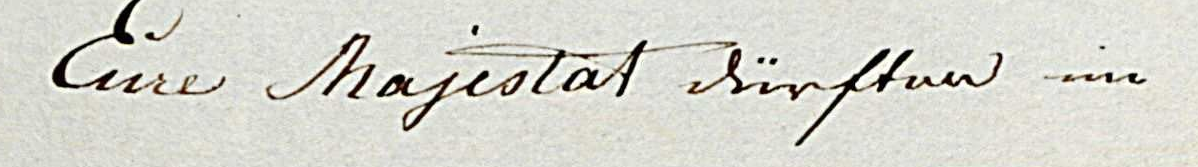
Eure Majestät dürften im
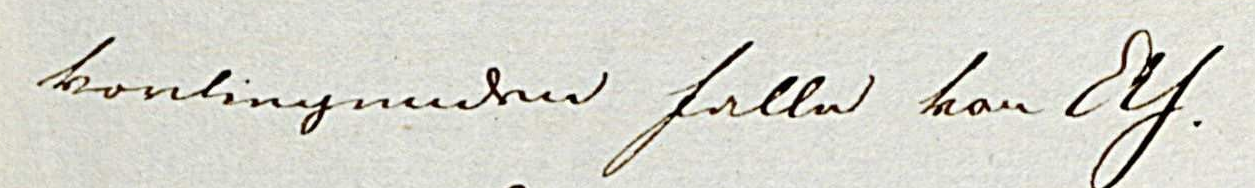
vorliegenden Falle von Ah
